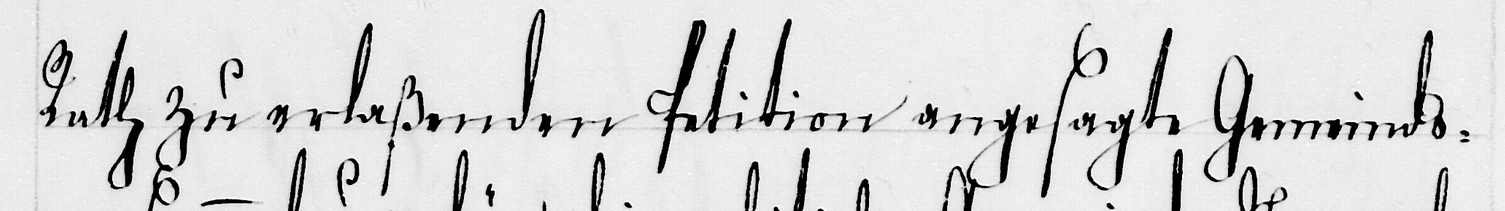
Rath zu erlaßenden Petition angesagte Gemeinds¬
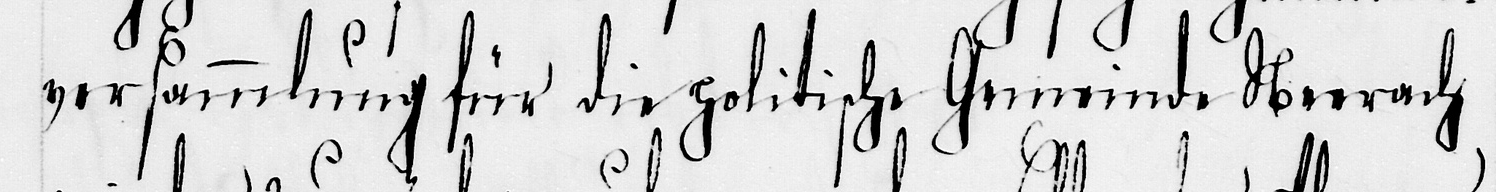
versammlung für die politische Gemeinde Neerach
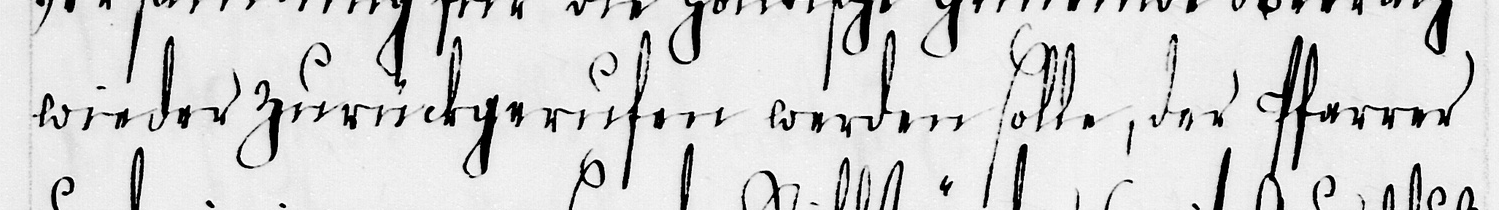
wieder zurückgerufen werden solle, der Pfarrer
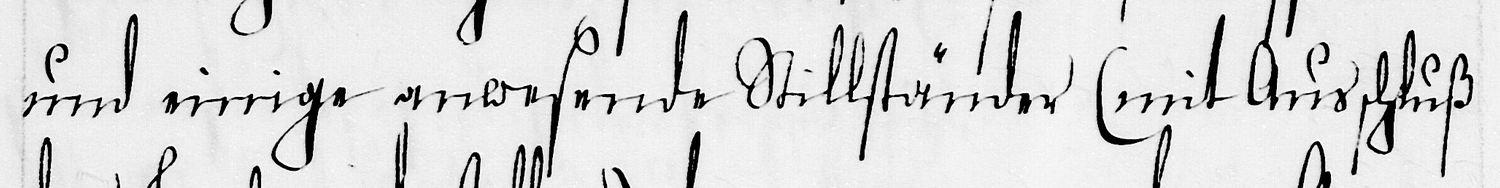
und einige anwesende Stillständer (mit Ausschluß
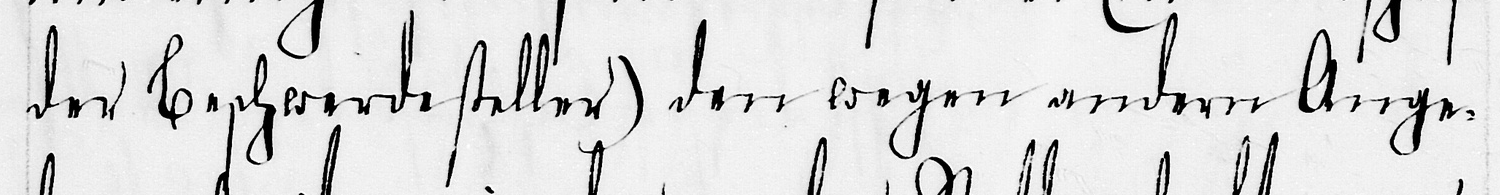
der Beschwerdesteller) den wegen andern Ange¬
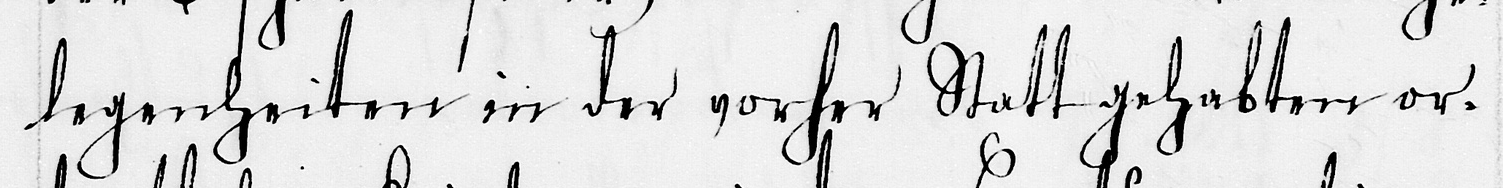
legenheiten in der vorher Statt gehabten or¬
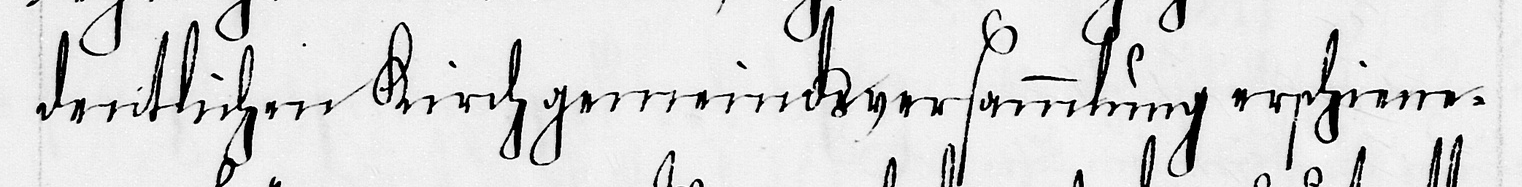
dentlichen Kirchgemeindsversammlung erschiene¬
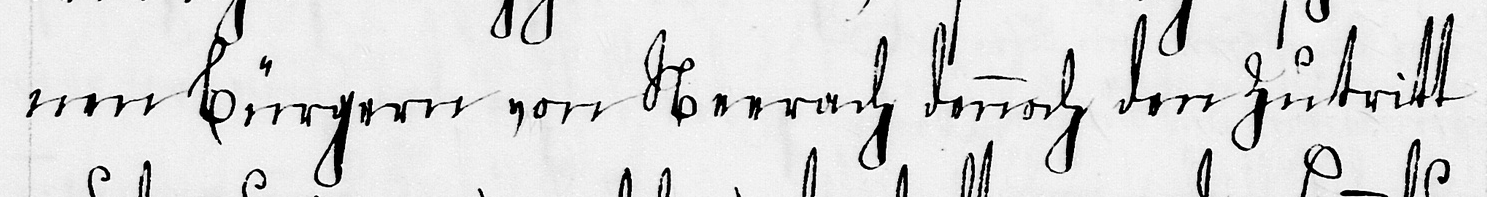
nen Bürgern von Neerach dennoch den Zutritt
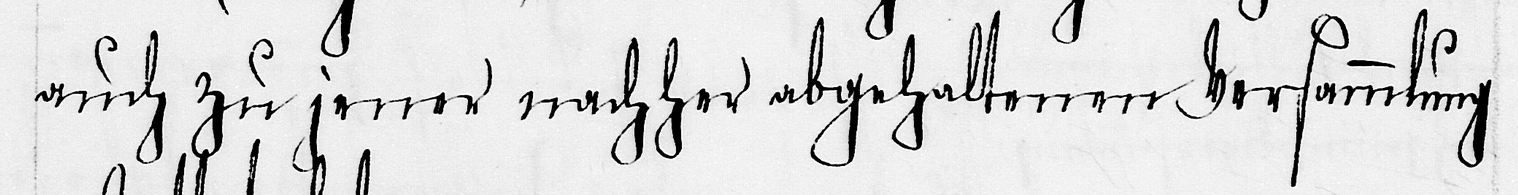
auch zu jener nachher abgehaltenen Versammlung
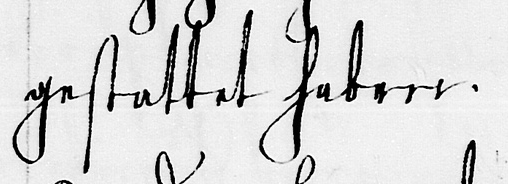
gestattet haben.
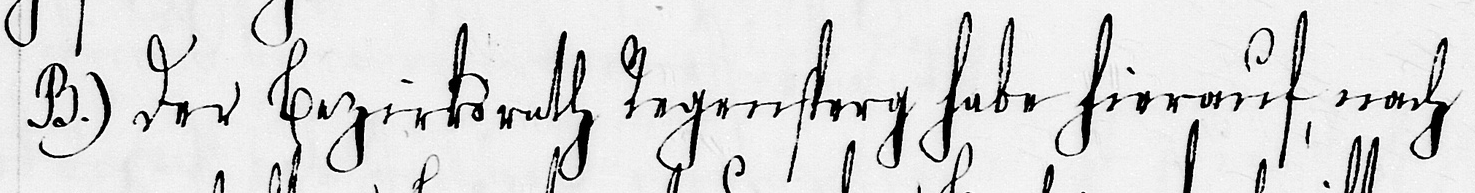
B.) Der Bezirksrath Regensperg habe hierauf, nach
